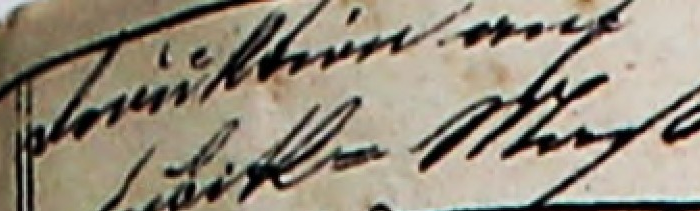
Reduktion auf
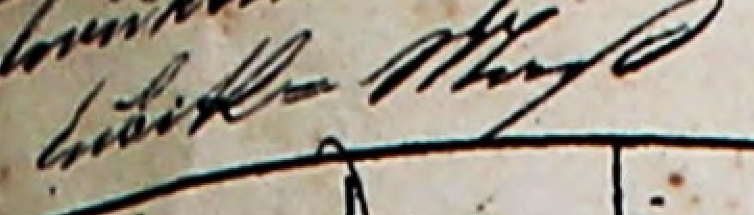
Cubik= Maß
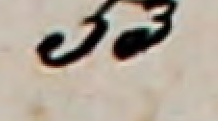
53
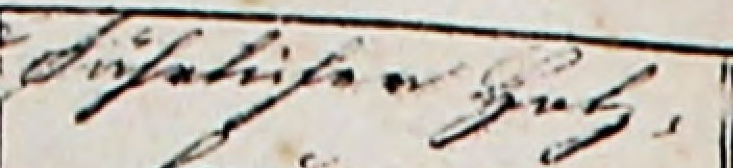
Jährlicher Holz„
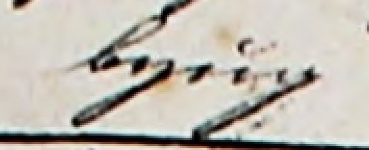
bezug
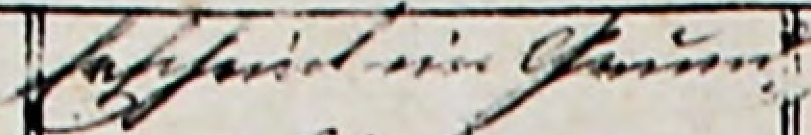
Erscheint im Grund„
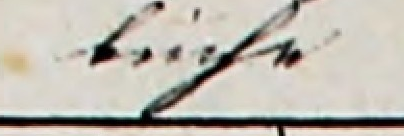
buche
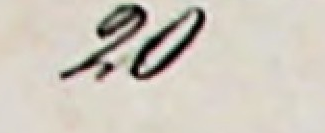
20
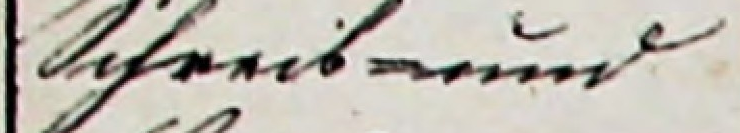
Schreib = und
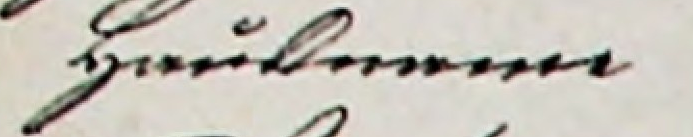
Hausmann
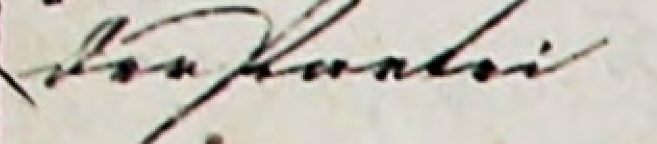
der Partei
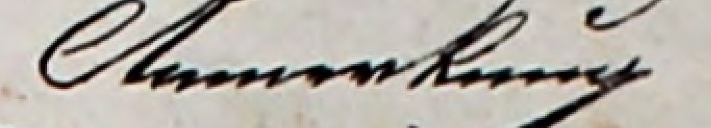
Anmerkung
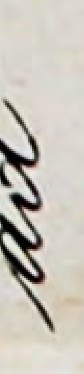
ad
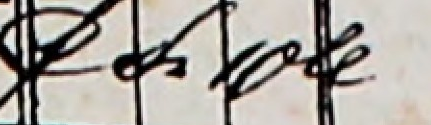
???
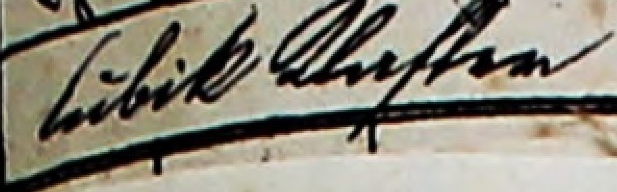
Cubik Klafter
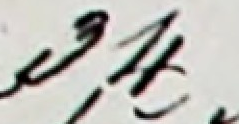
34
